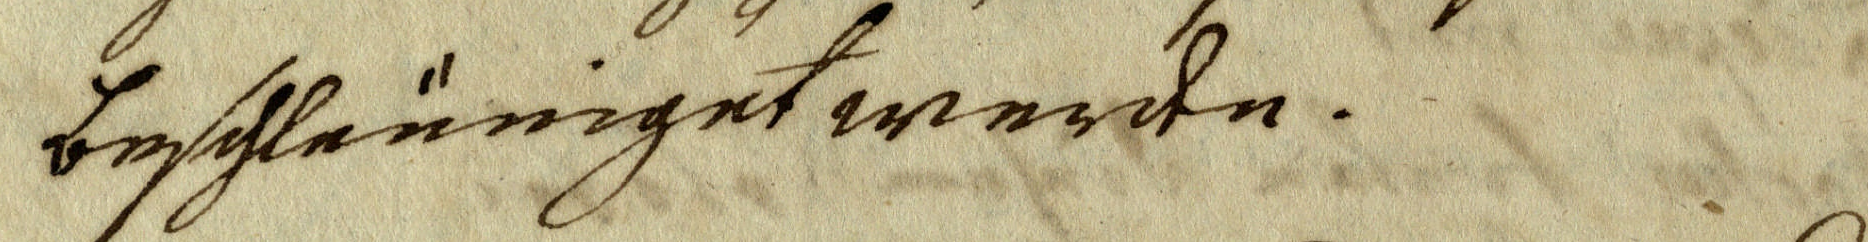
beschleuniget werden.
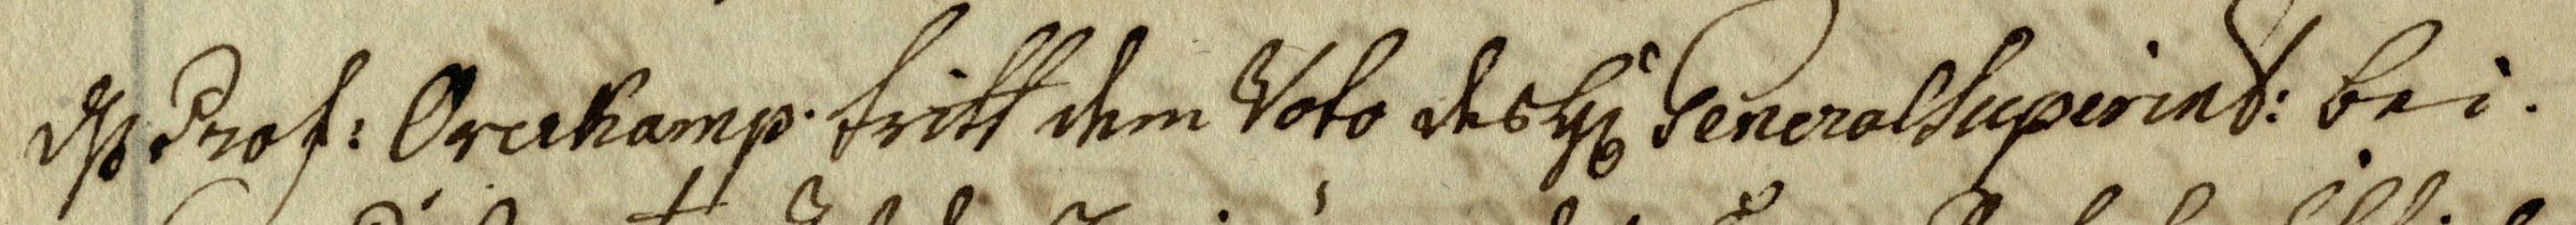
dh. Prof. Overkamp. tritt dem Voto des H. GeneralSuperint. bei.
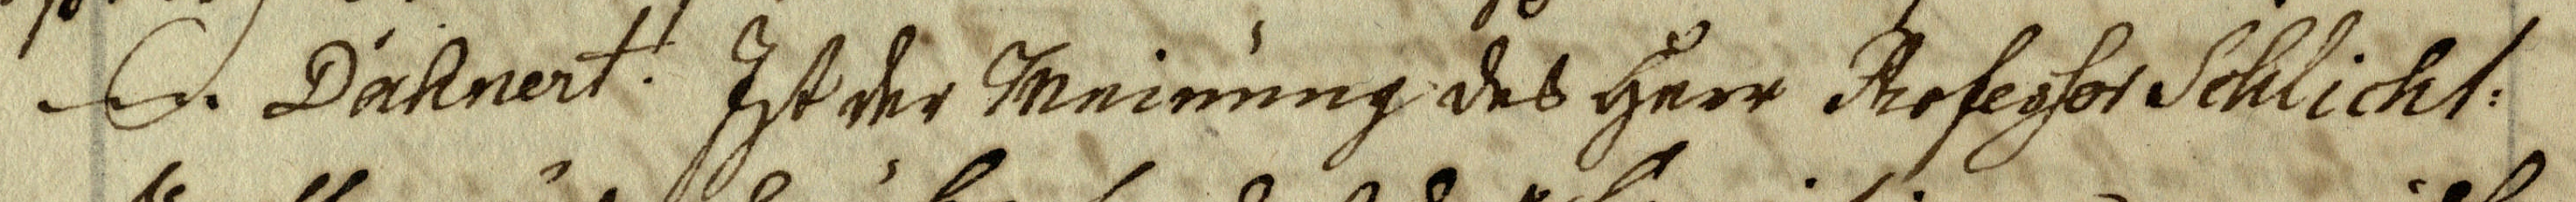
Dähnert. Ist der Meinung des Herr Professor Schlicht¬
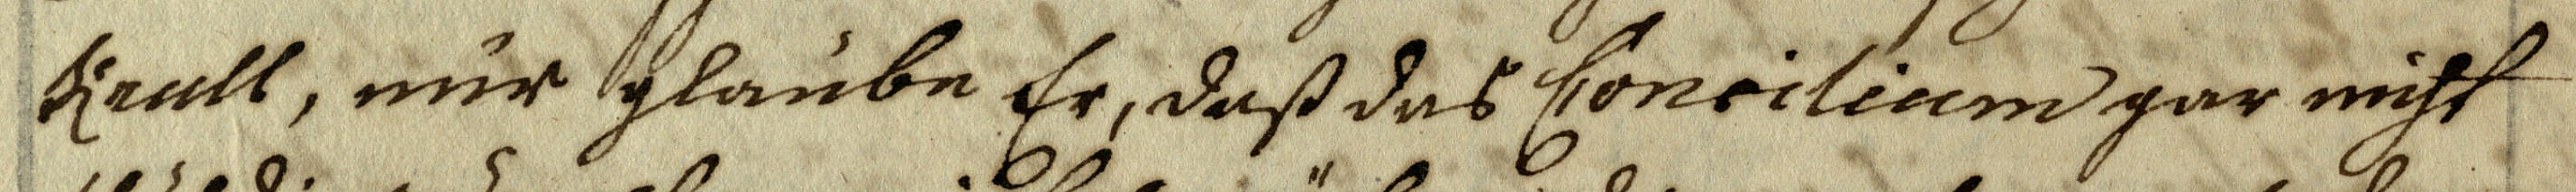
krull, nur glaube Er, daß das Concilium gar nicht
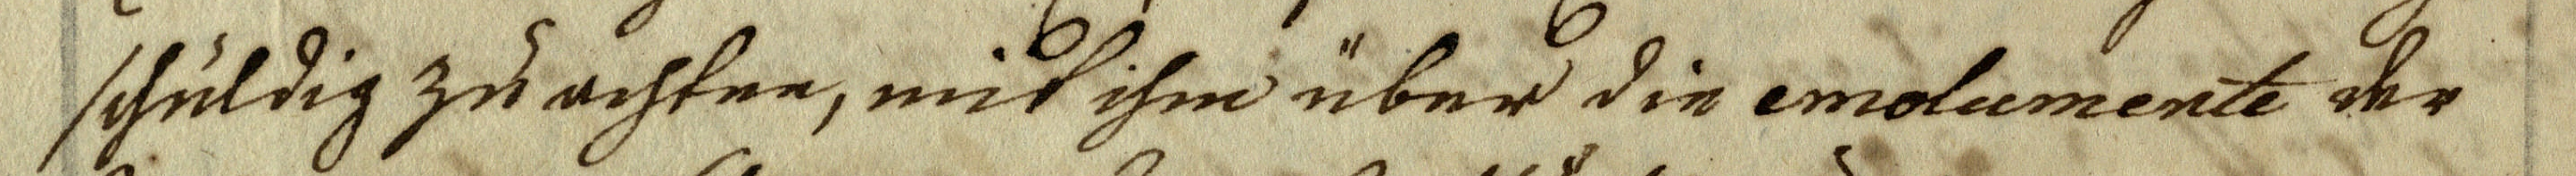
schuldig zu achten, mit ihm über die emolumente der
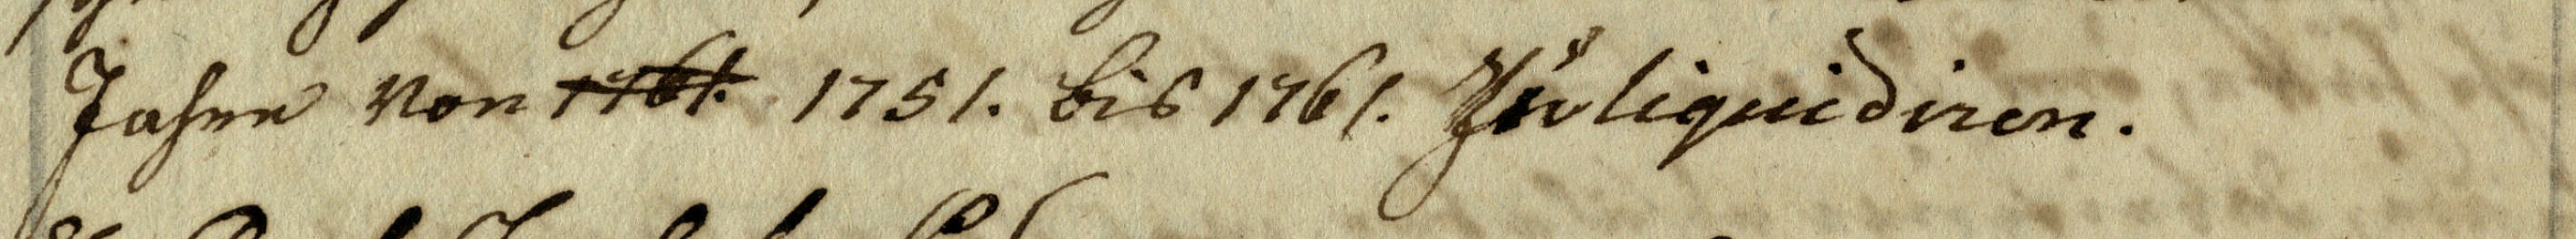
Jahre von 1751. bis 1761. zu liquidiren.
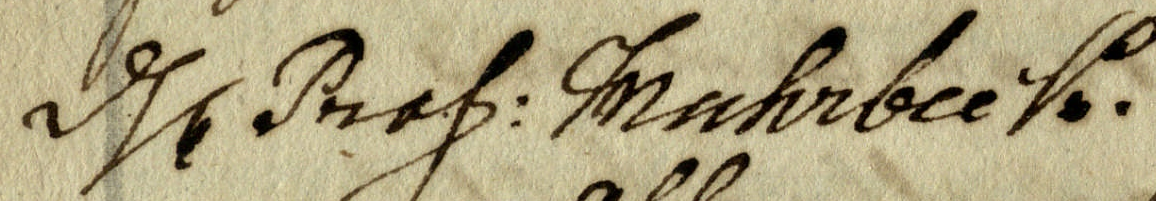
dh Prof. Muhrbeck
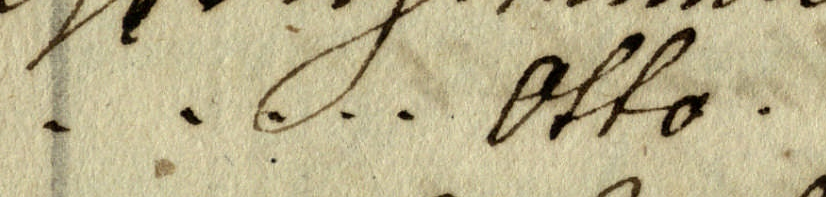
Otto.
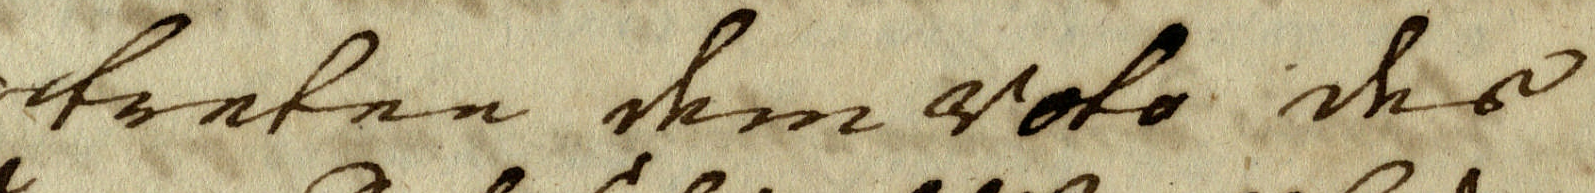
treten dem voto des
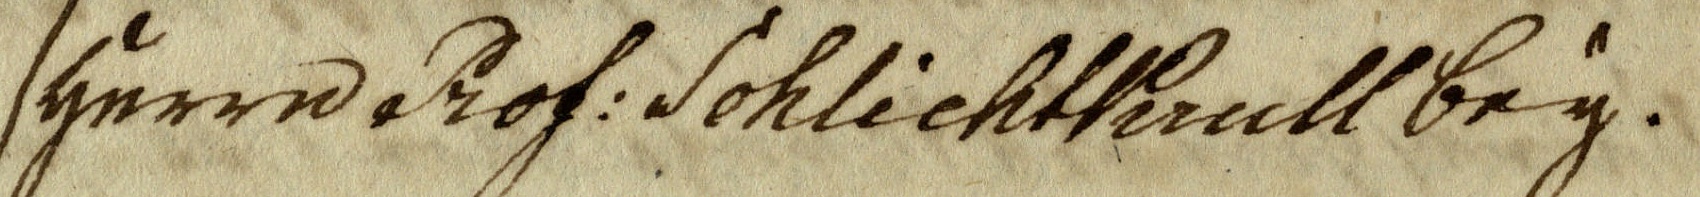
Herrn Prof. Schlichtkrull beÿ.
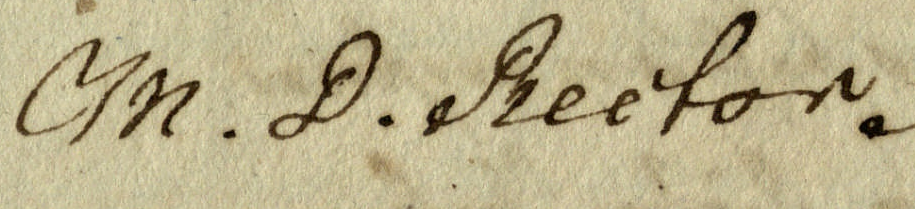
M. D. Rector
